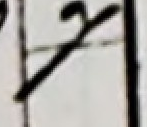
7
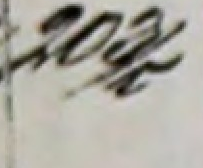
203/c
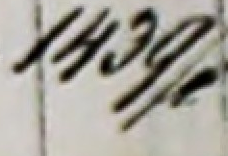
1439/e
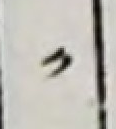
„
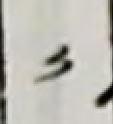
„
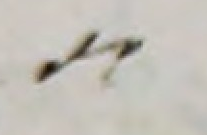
Do
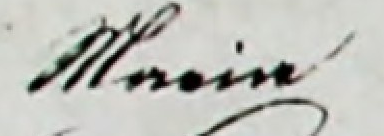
Marie
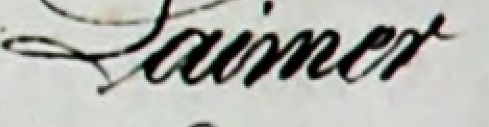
Laimer
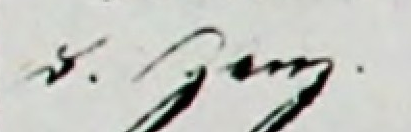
v. Zeuz
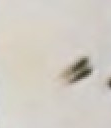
„
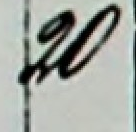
20
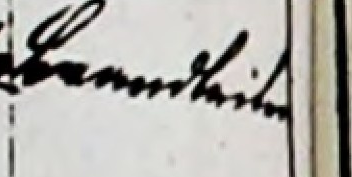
Brandleiter
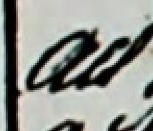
Ad
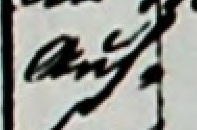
Aus„
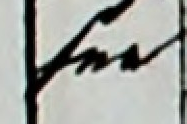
see
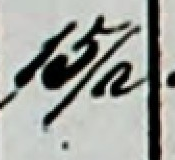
15/a
